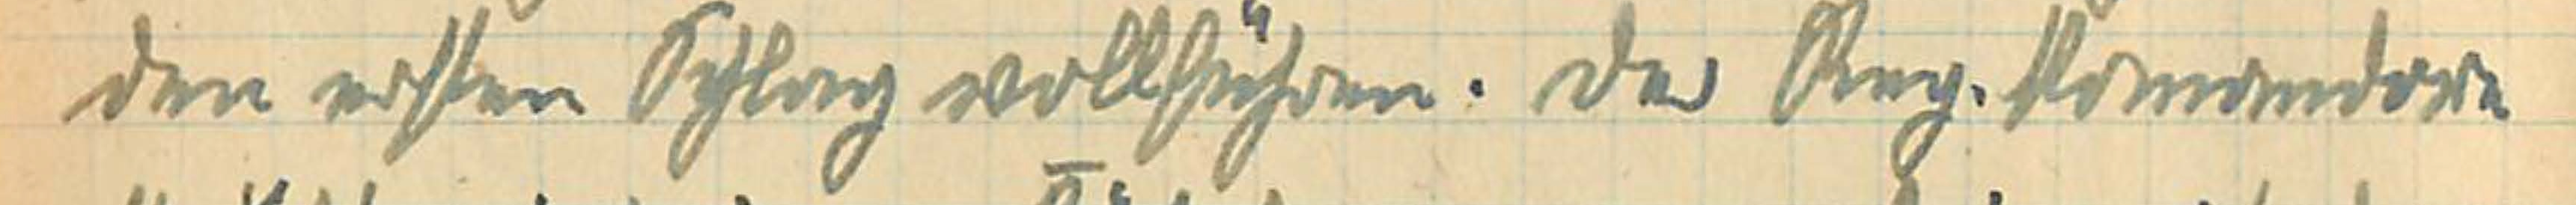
den ersten Schlag vollführen. Der Reg.komandore
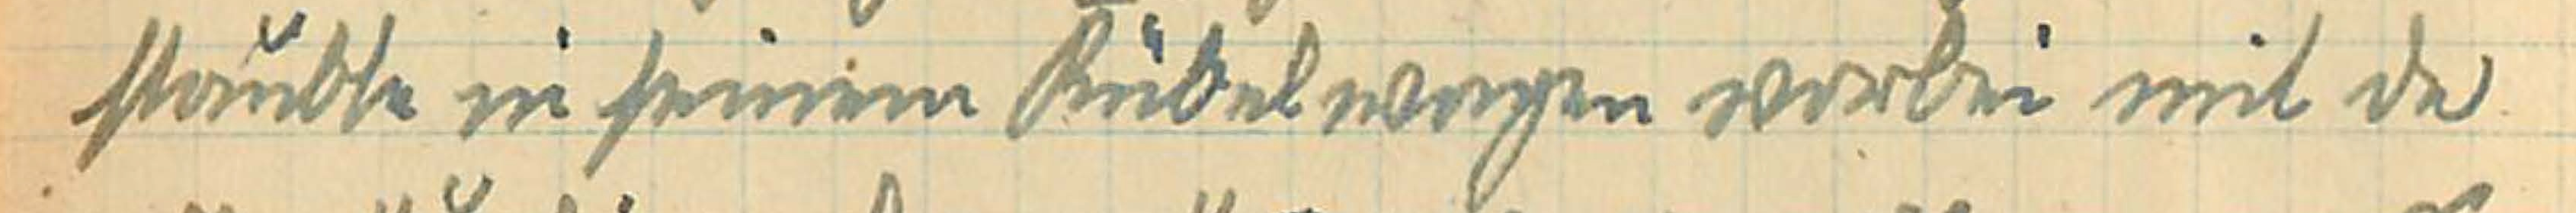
staubte in seinem Kübelwagen vorbei mit der
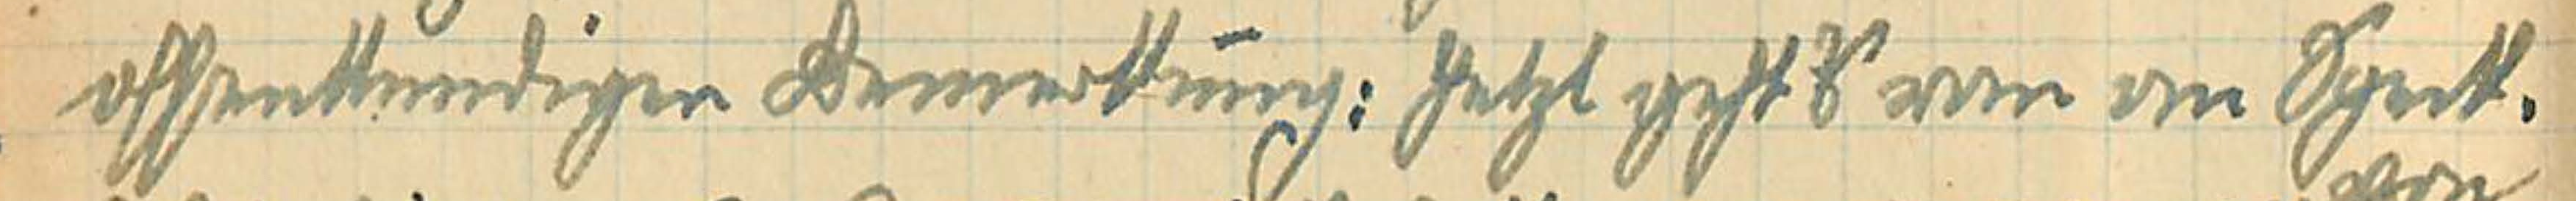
offenkundigen Bemerkung: Jetzt geht´s ran an Speck.
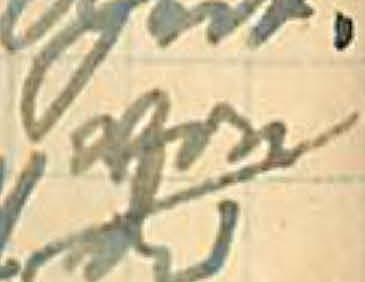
von
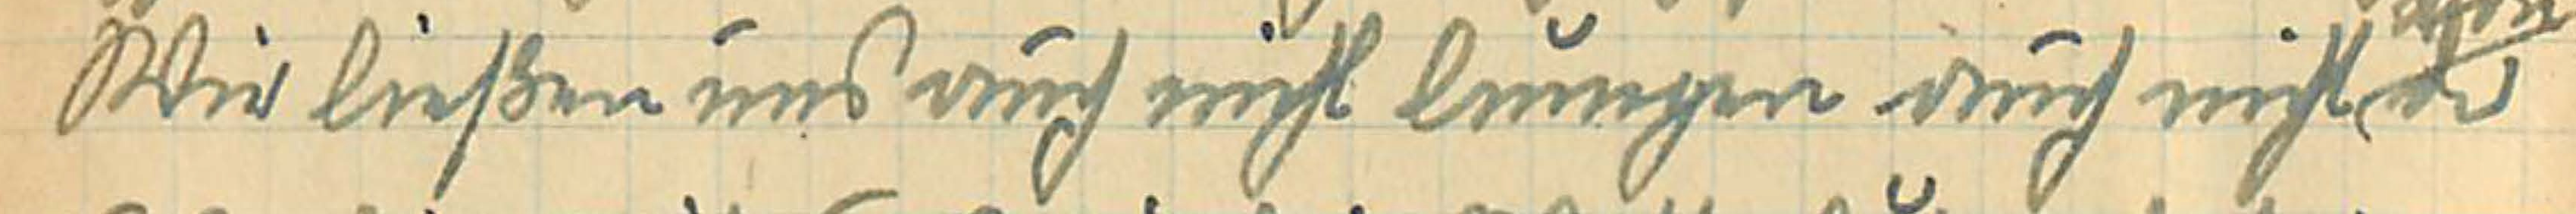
Wir ließen uns auch nicht lumpen auch nicht der
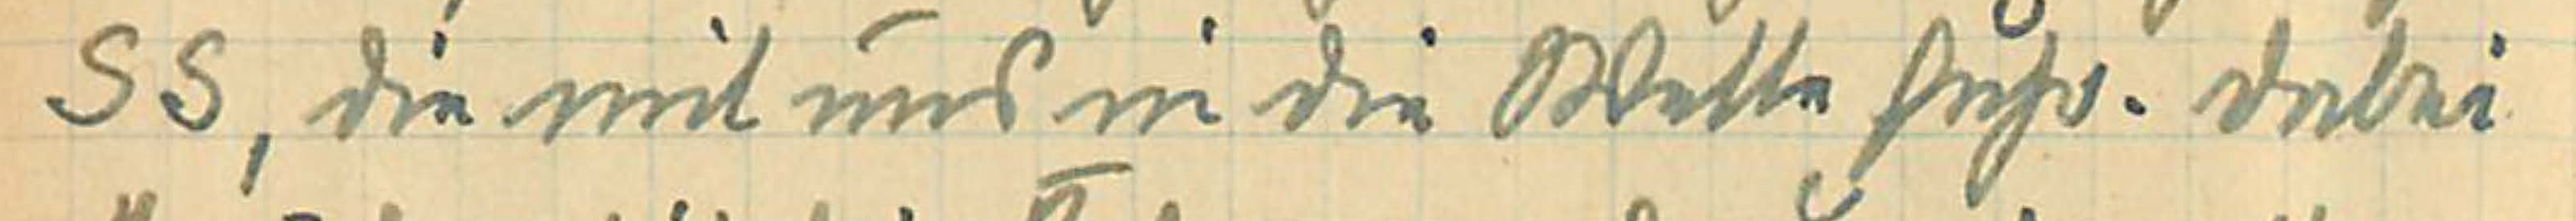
SS, die mit uns in die Wette fuhr. Dabei
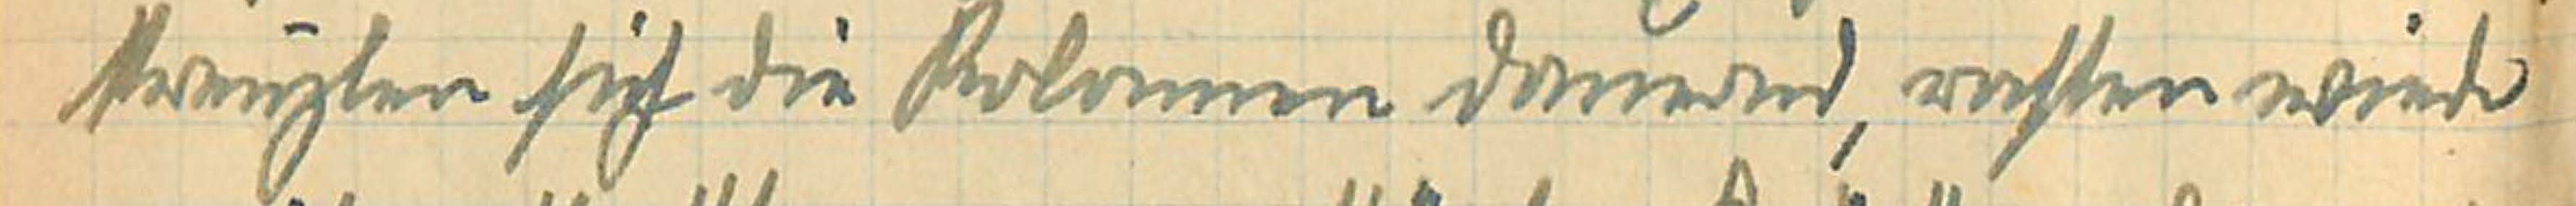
kreuzten sich die Kolonnen dauernd, rasten wieder
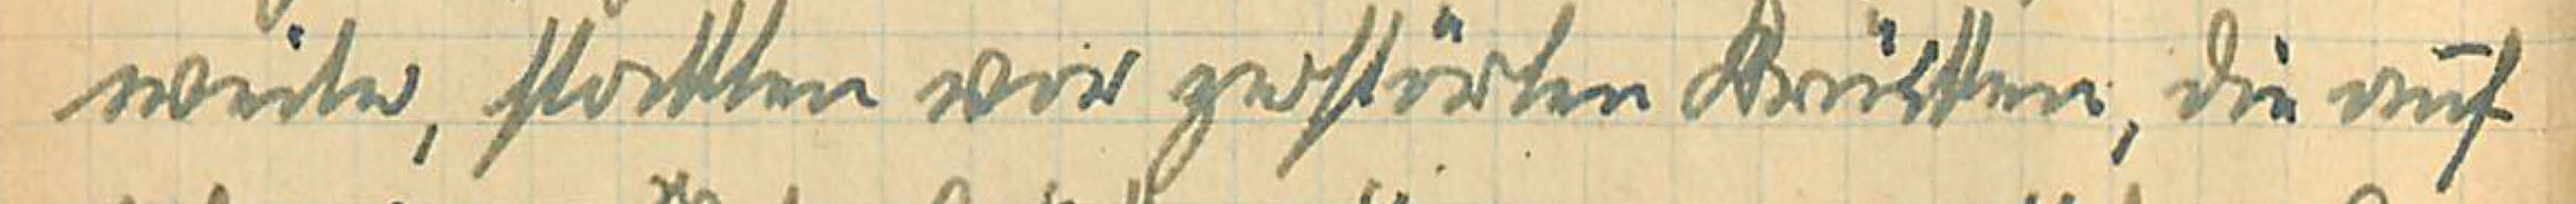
weiter, stockten vor zerstörten Brücken, die auf
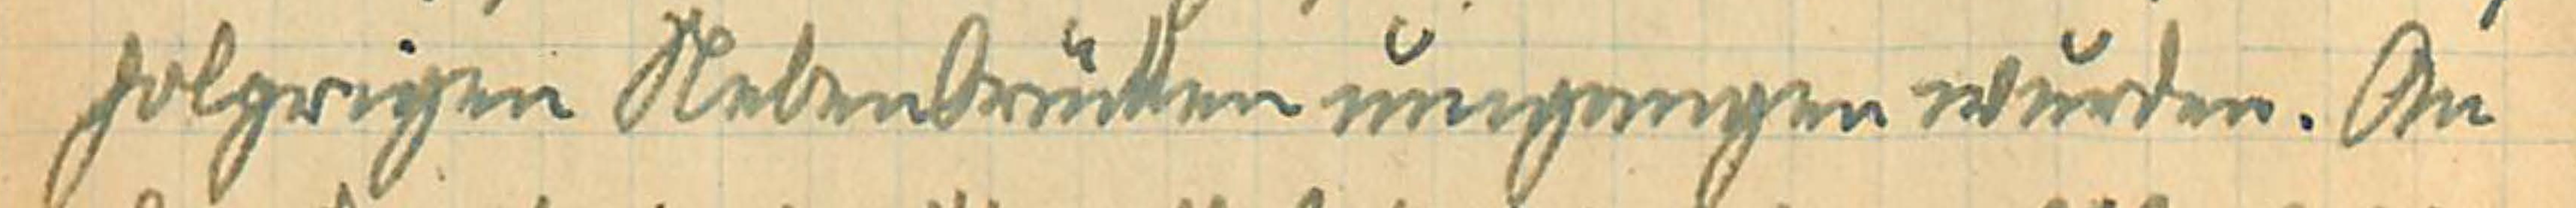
holprigen Nebenbrücken umgangen wurden. An
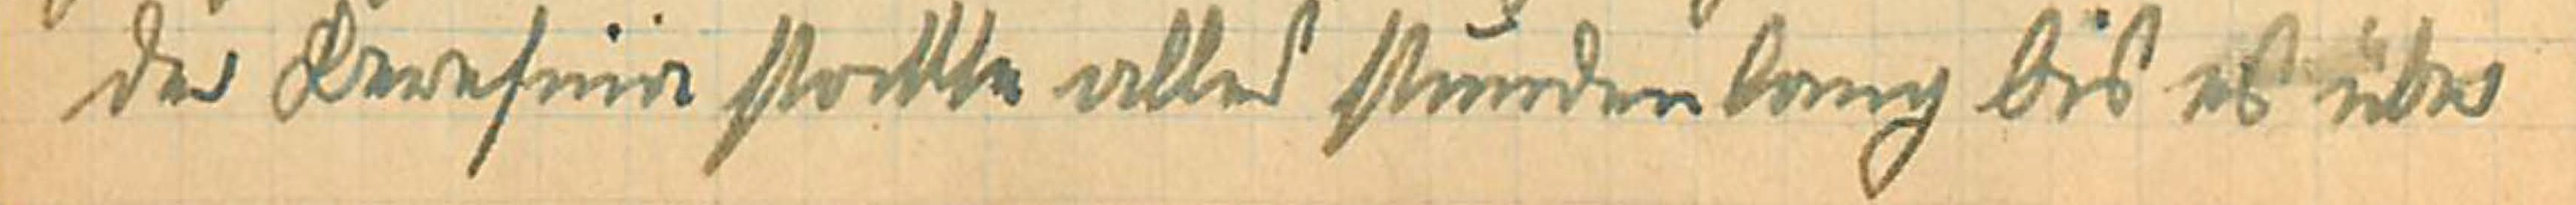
der Beresina stockte alles stundenlang bis es über
